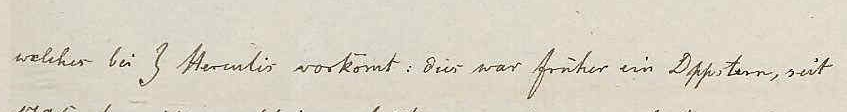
welches bei ζ Herculis vorkömt: dies war früher ein Dppstern, seit
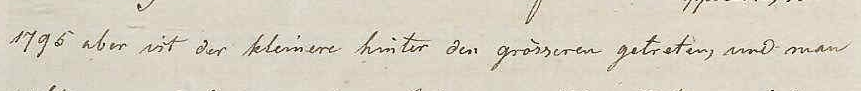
1795 aber ist der kleinere hinter den grösseren getreten, und man
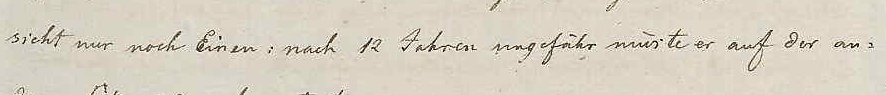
sieht nur noch eEinen: nach 12 Jahren ungefähr müste er auf der an-
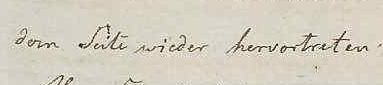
dern Seite wieder hervortreten.
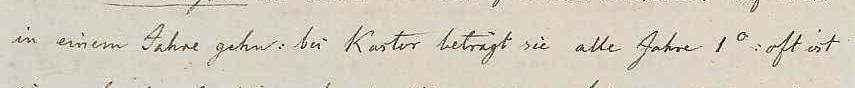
in einem Jahre gehn: bei Kastor beträgt sie alle Jahre 1°: oft ist
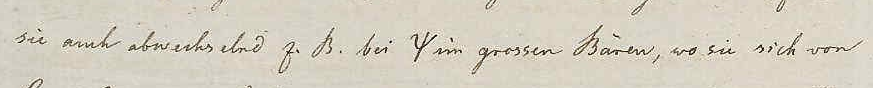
sie auch abwechselnd z. B. bei Ψ im grossen Bären, wo sie sich von
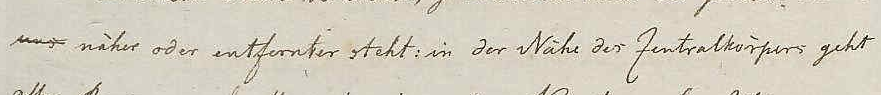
uns näher oder entfernter steht: in der Nähe des Zentralkörpers geht
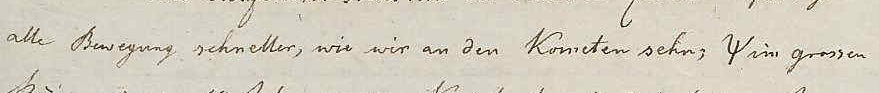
alle Bewegung schneller, wie wir an den Kometen sehn; Ψ im grossen
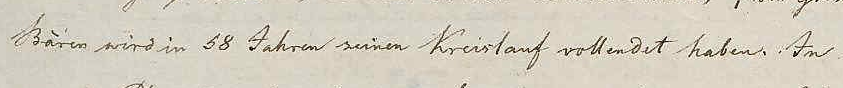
Bären wird in 58 Jahren seinen Kreislauf vollendet haben. In
